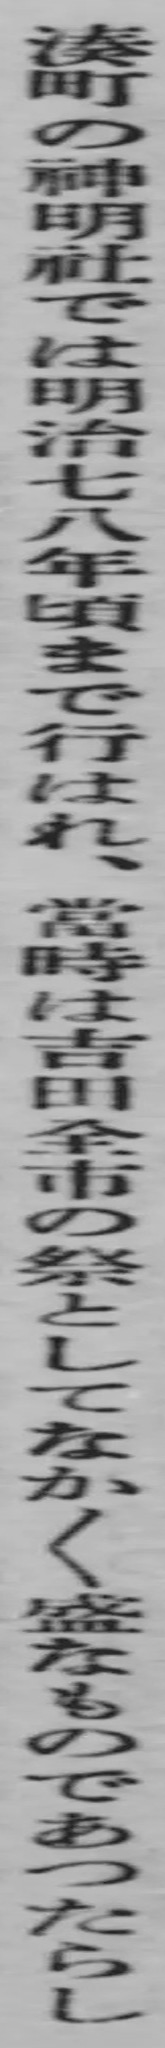湊町の神明社では明治七八年頃まで行はれ、當時は吉田全市の祭としてなか〳〵盛なものであつたらし
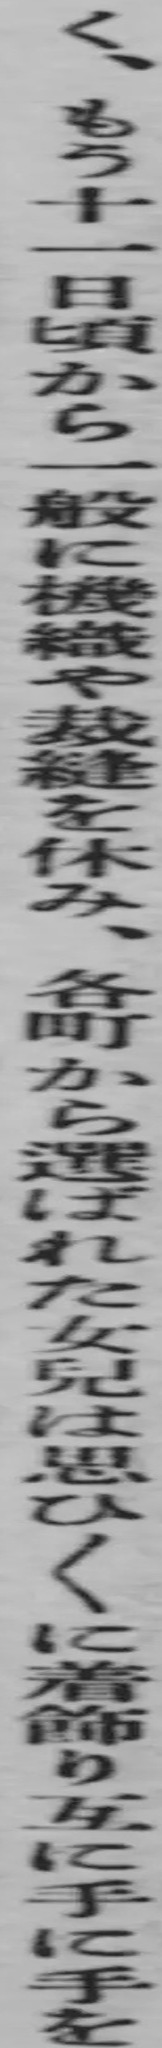く、もう十一日頃から一般に機織や裁縫を休み、各町から選ばれた女兒は思ひ〳〵に着飾り互に手に手を
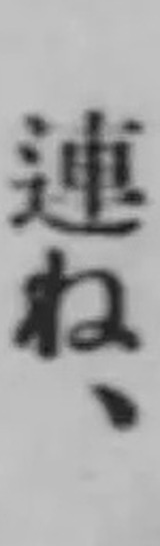連ね、
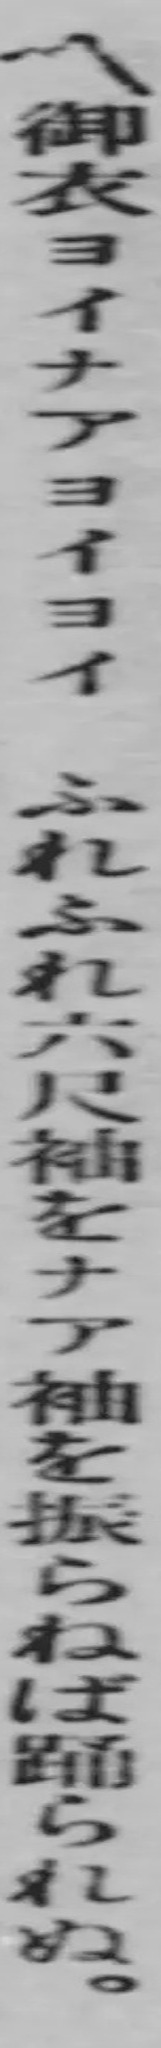〽御衣ヨイナアヨイヨイふれふれ六尺袖をナア袖を振らねば踊られぬ。
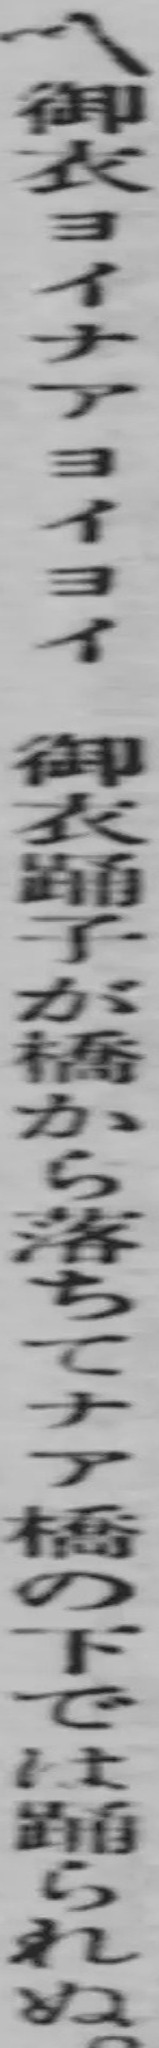〽御衣ヨイナアヨイヨイ御衣踊子が橋から落ちてナア橋の下では踊られぬ。
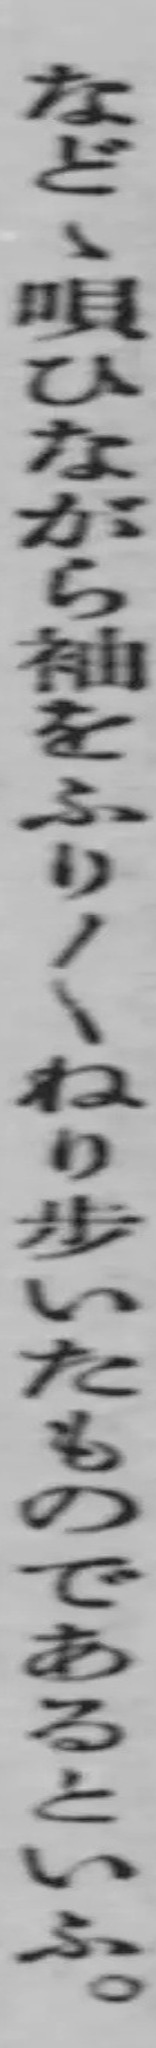などゝ唄ひながら袖をふり〳〵ねり歩いたものであるといふ。
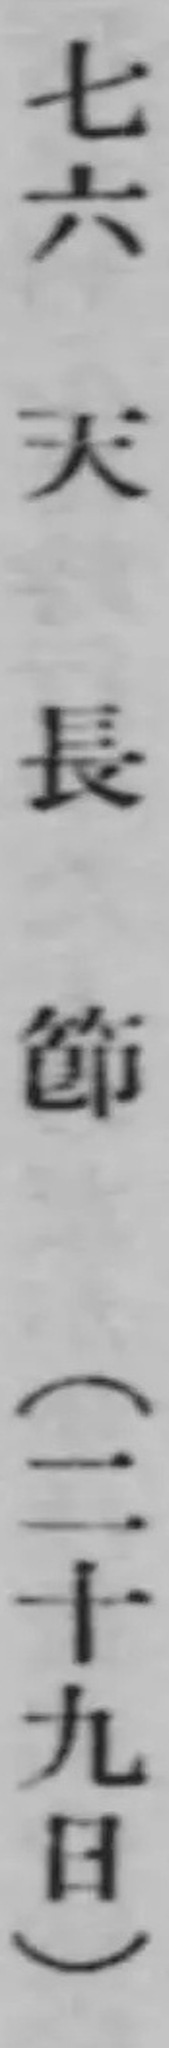七六天長節(二十九日)
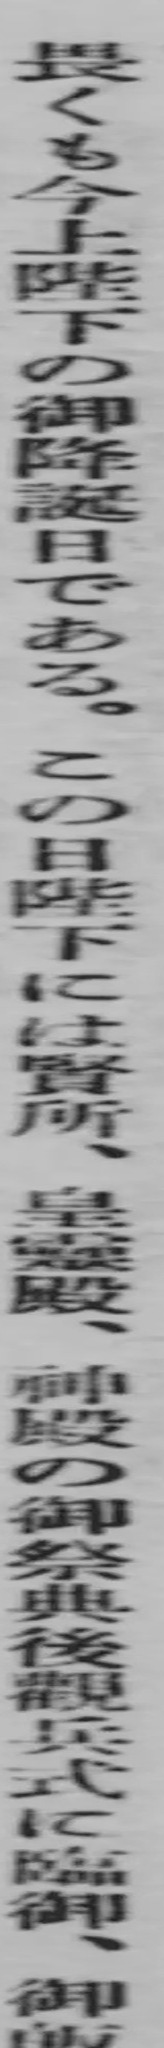畏くも今上天皇の御降誕日である。この日陛下には賢所、皇靈殿、神殿の御祭典後觀兵式に臨御、御皈
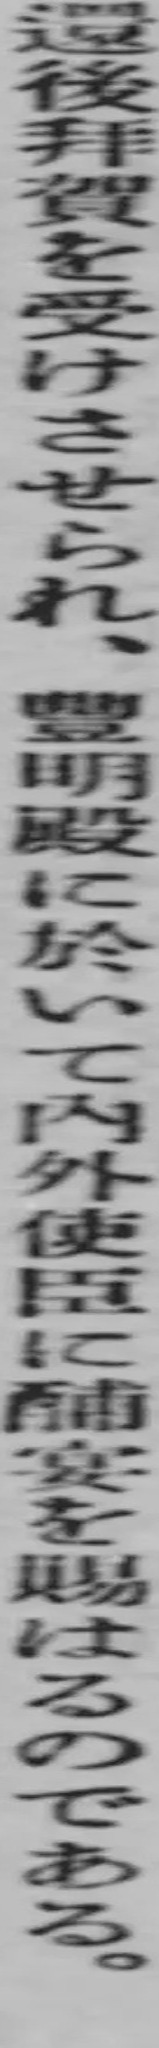還後拜賀を受けさせられ、豐明殿に於いて内外使臣に酺宴を賜はるのである。
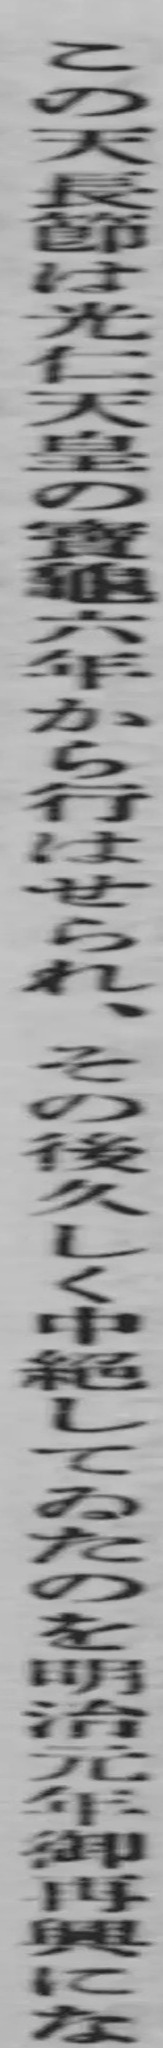この天長節は光仁天皇の寶龜六年から行はせられ、その後久しく中絕してゐたのを明治元年御再興にな
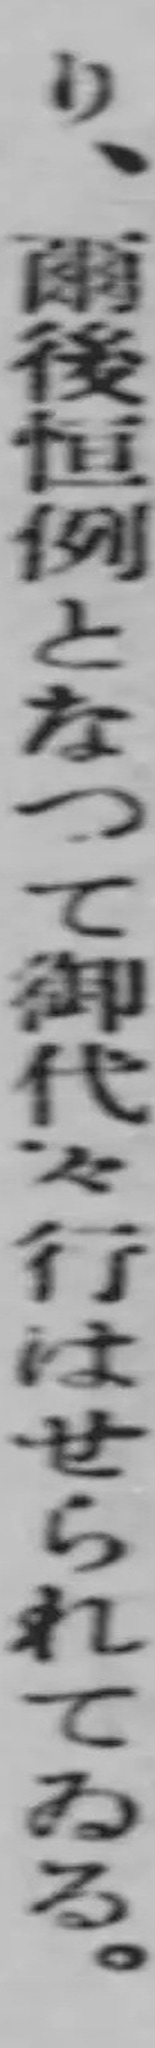り、爾後恒例となつて御代々行はせられてゐる。
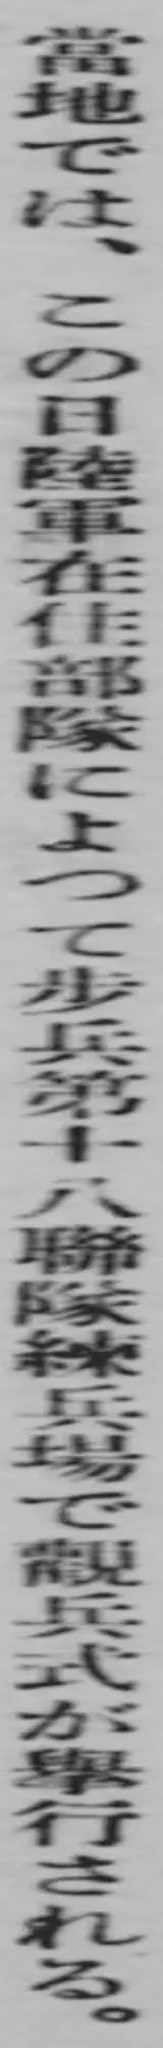當地では、この日陸軍在住部隊によつて歩兵第十八聯隊練兵場で觀兵式が擧行される。

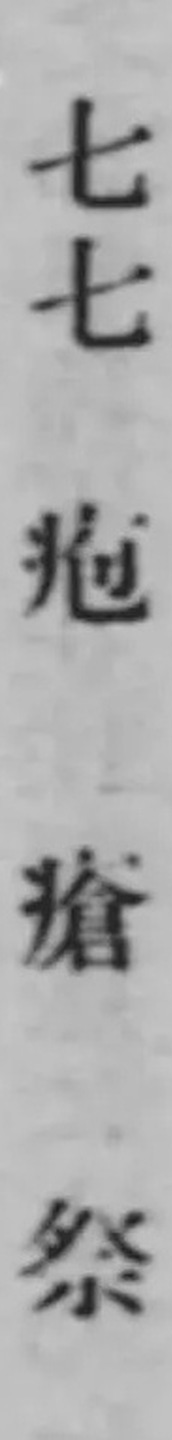七七疱瘡祭
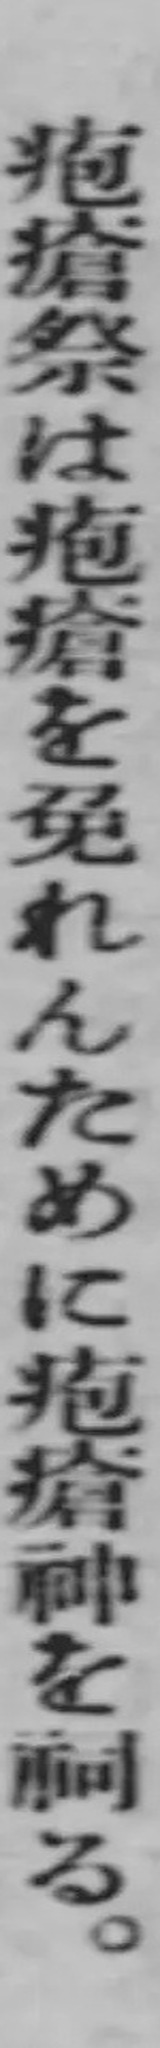疱瘡祭は疱瘡を免れんために疱瘡神を祠る。
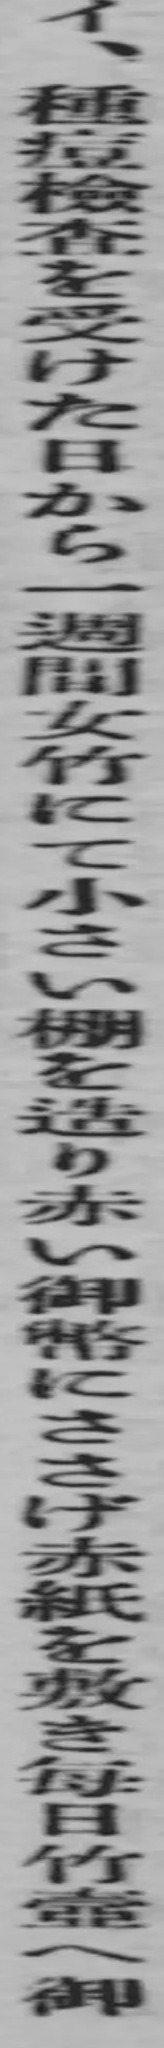イ、種痘検査を受けた日から一週間女竹にて小さい棚を造り赤い御幣にささげ赤紙を敷き每日竹壺へ御
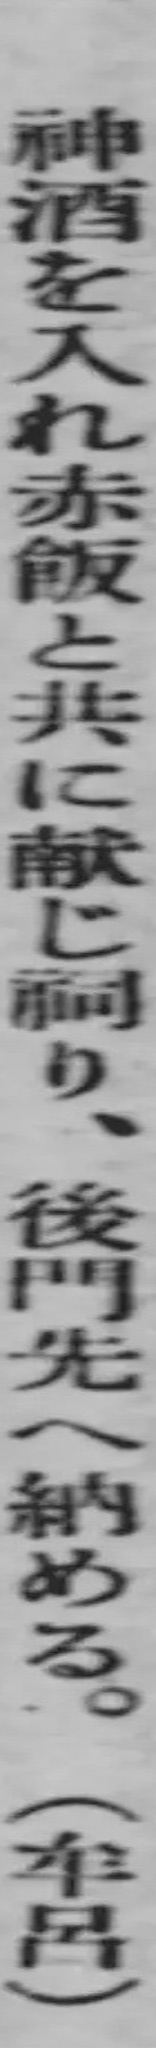神酒を入れ赤飯と共に献じ祠り、後門先へ納める。(牟呂)
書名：豊橋の年中行事
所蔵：国立国会図書館 National Diet Library, JAPAN
